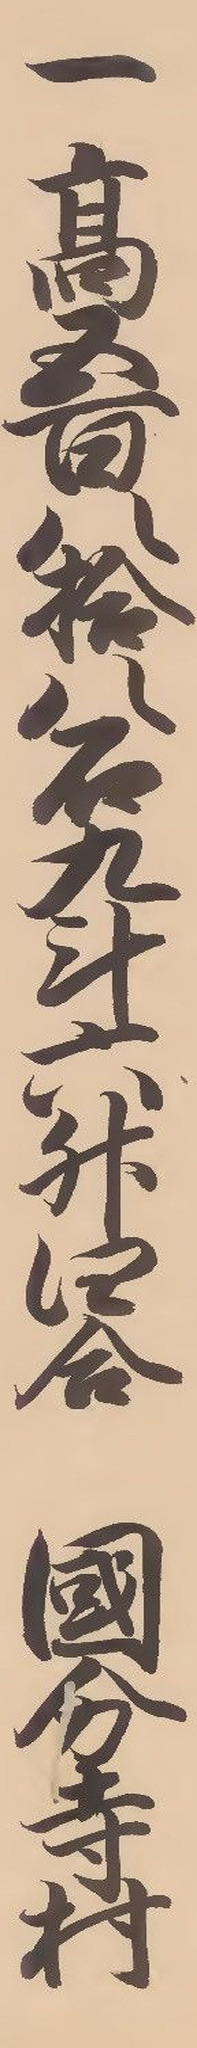一高五百八拾八石九斗六升四合国分寺村
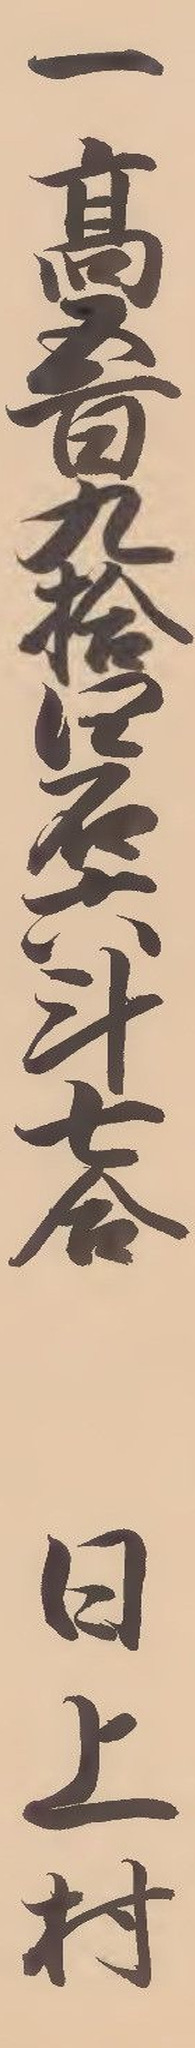一高五百九拾四石六斗七合日上村
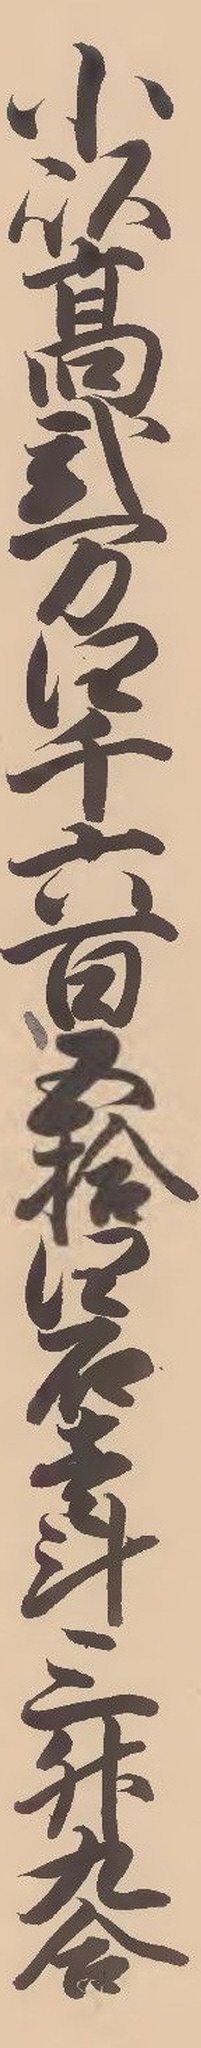小以高弐万四千六百五拾四石壱斗三升九合

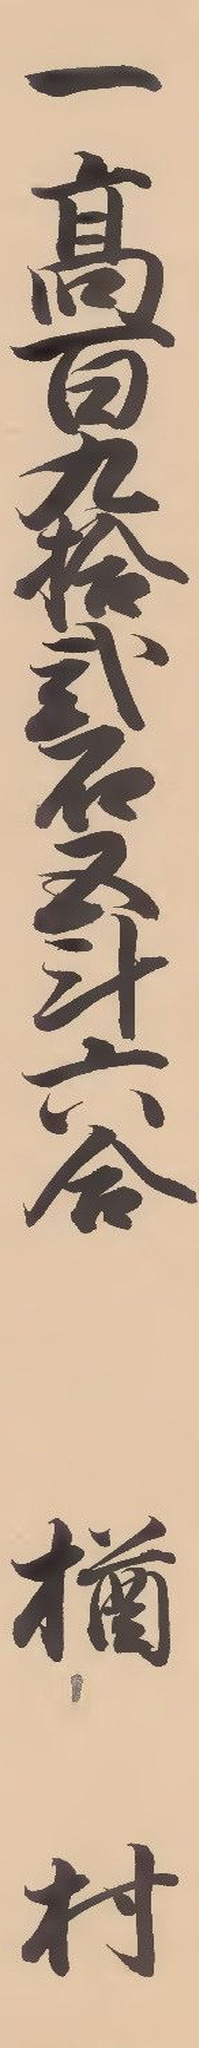一高百九拾弐石五斗六合楢村
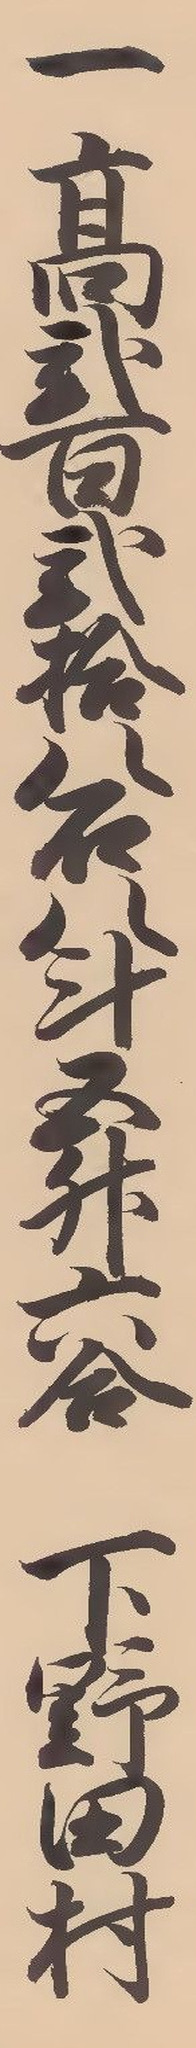一高弐百弐拾八石八斗五升六合下野田村
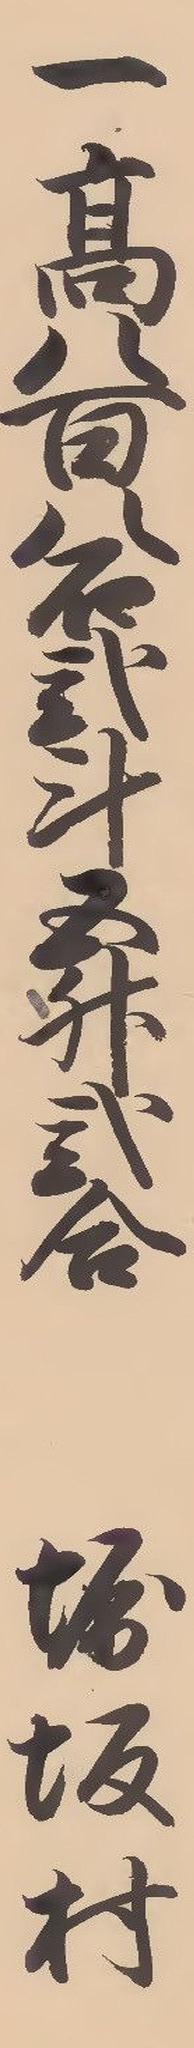一高八百八石弐斗五升弐合堀坂村

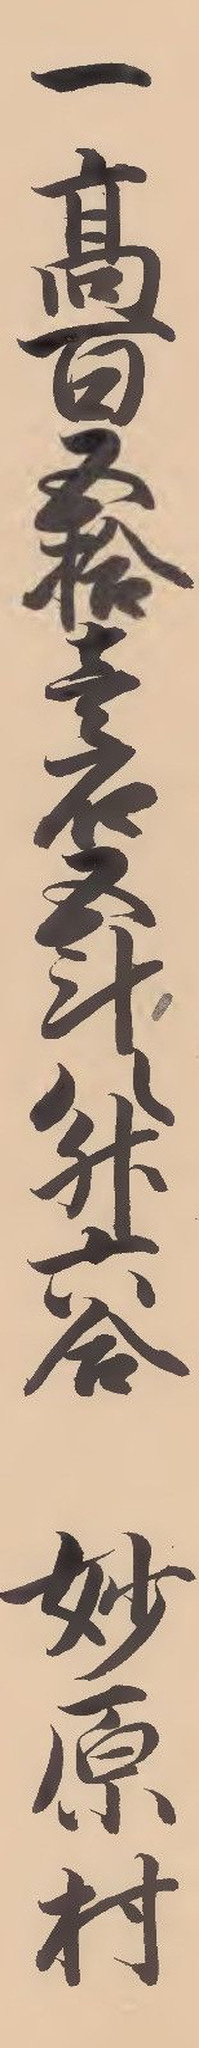一高百五拾壱石五斗八升六合妙原村
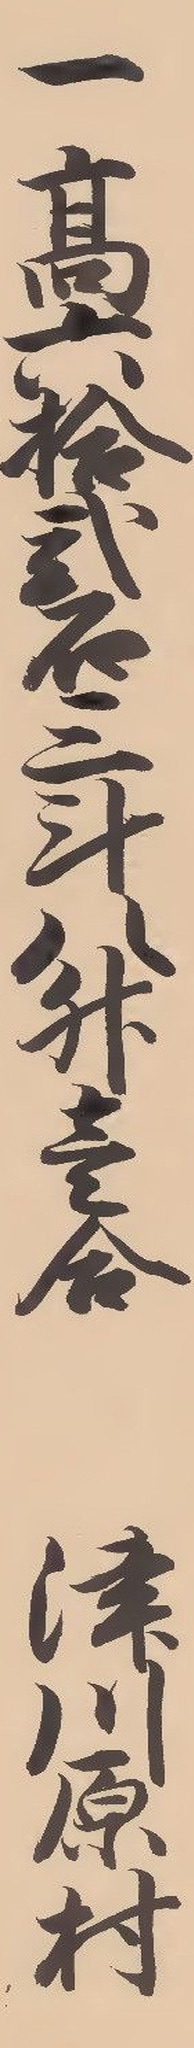一高六拾弐石三斗八升壱合津川原村
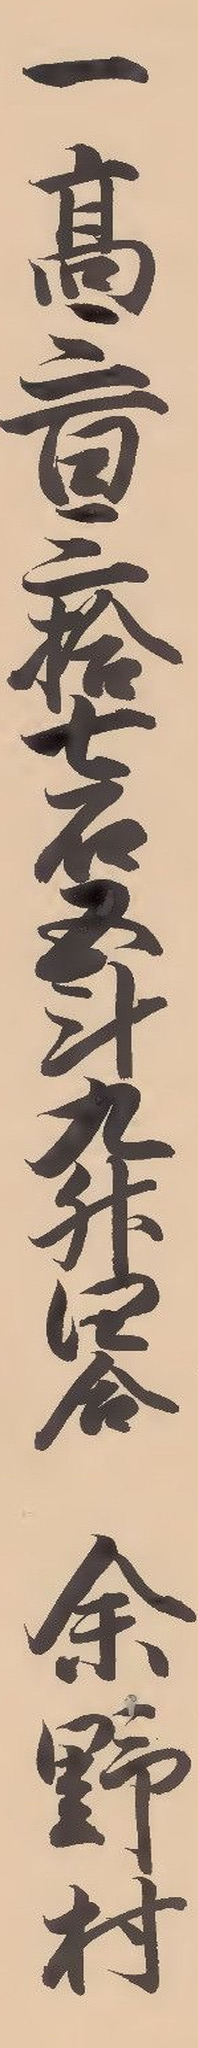一高三百三拾七石五斗九升四合余野村
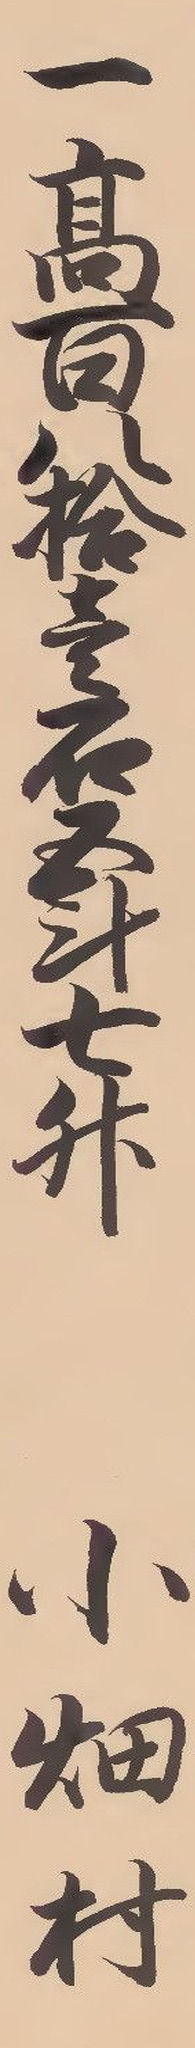一高百八拾壱石五斗七升小畑村
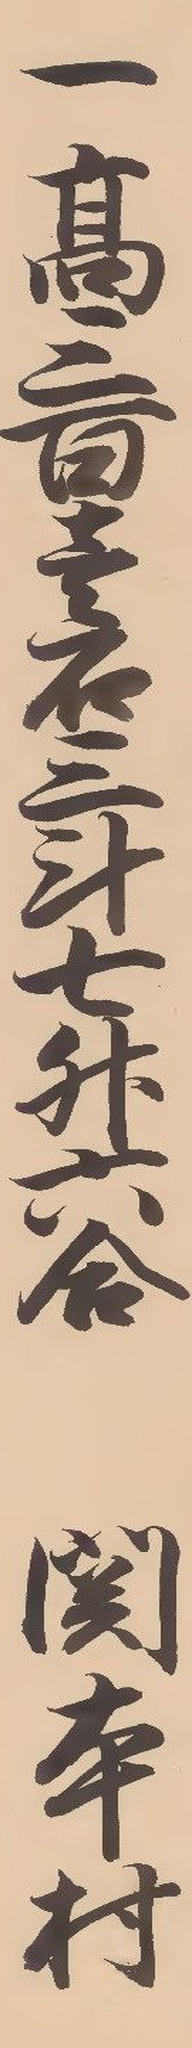一高三百壱石三斗七升六合関本村
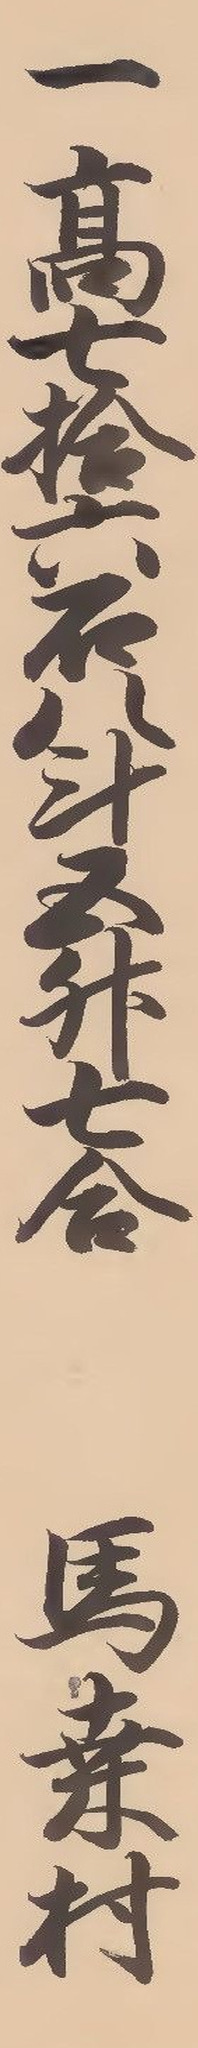一高七拾六石八斗五升七合馬桑村
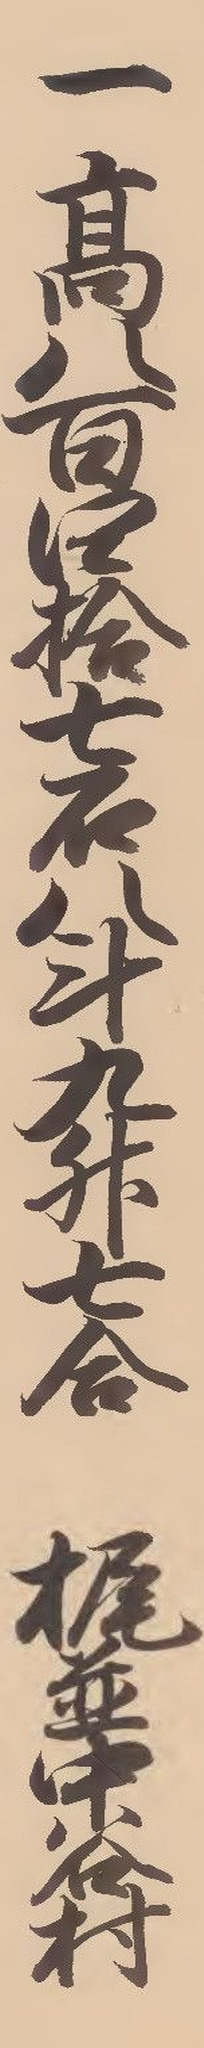一高八百四拾七石八斗九升七合梶並中谷村
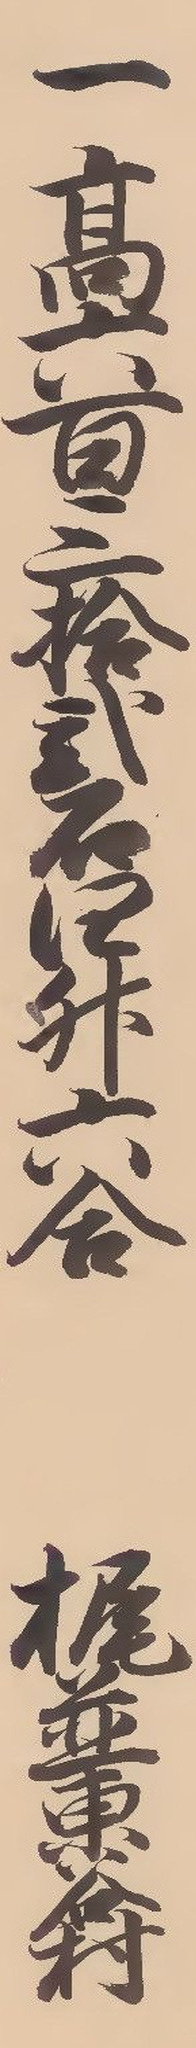一高六百三拾弐石四升六合梶並東谷村

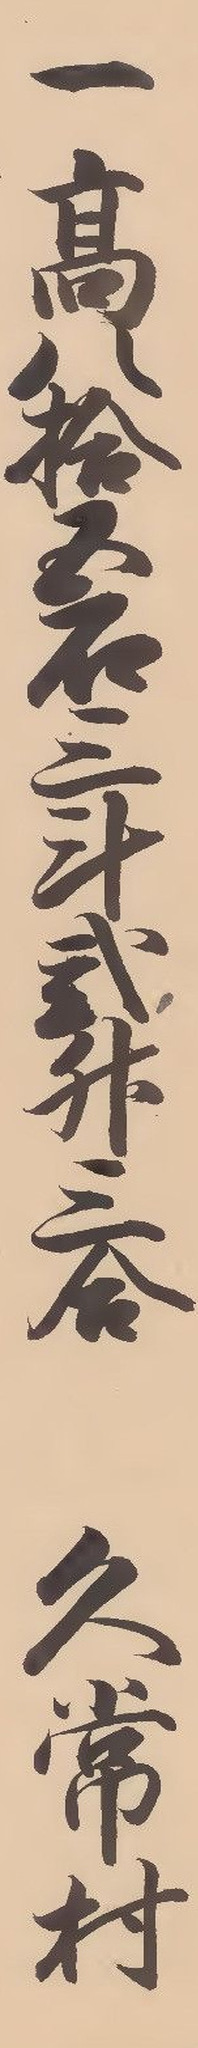一高八拾五石三斗弐升三合久常村
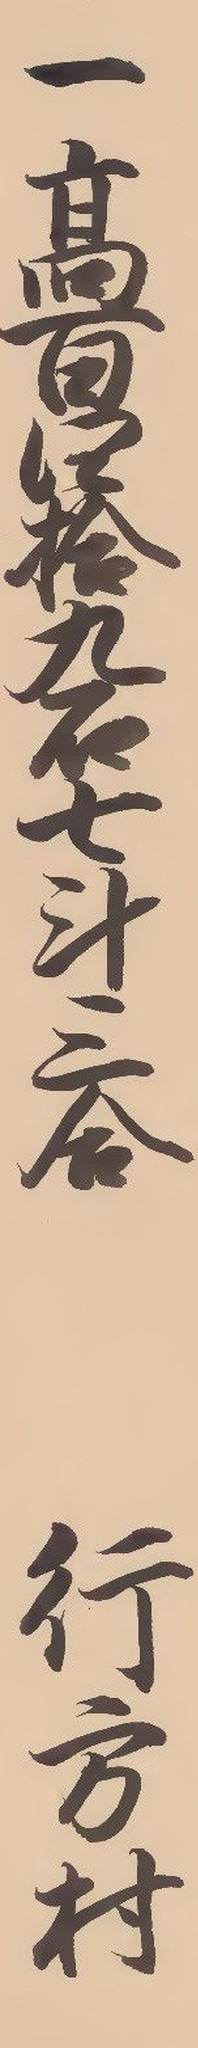一高百四拾九石七斗三合行方村
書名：美作国郷帳
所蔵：国立公文書館 National Archives of Japan
